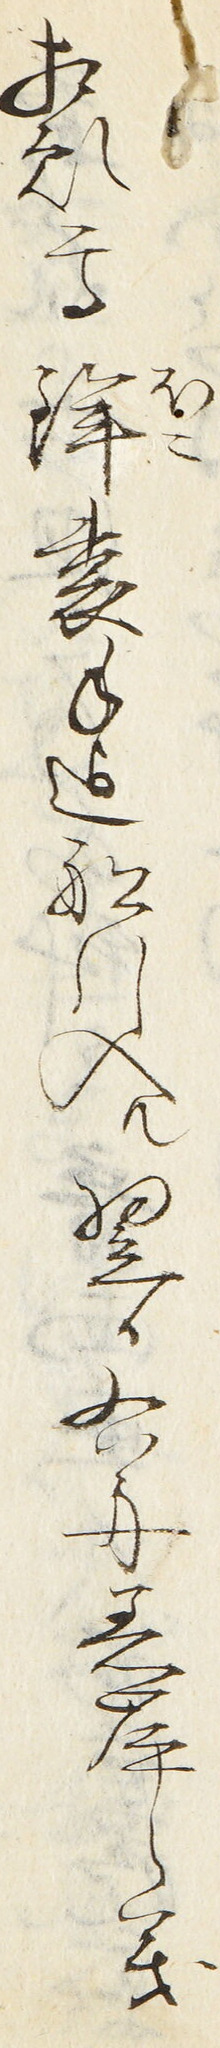相願高鉾裏手迄船引入る翌日右舟着岸之義
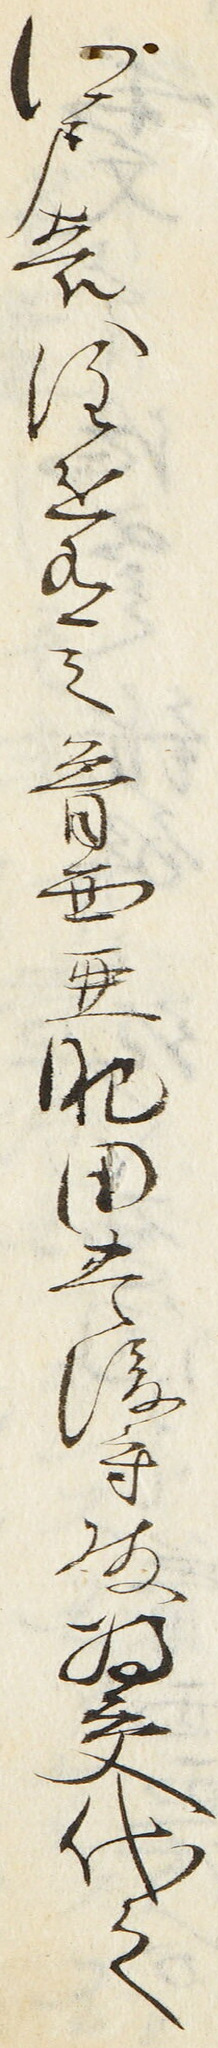江戸表へ注進有之魯西亜肥田豊後守殿為交代之
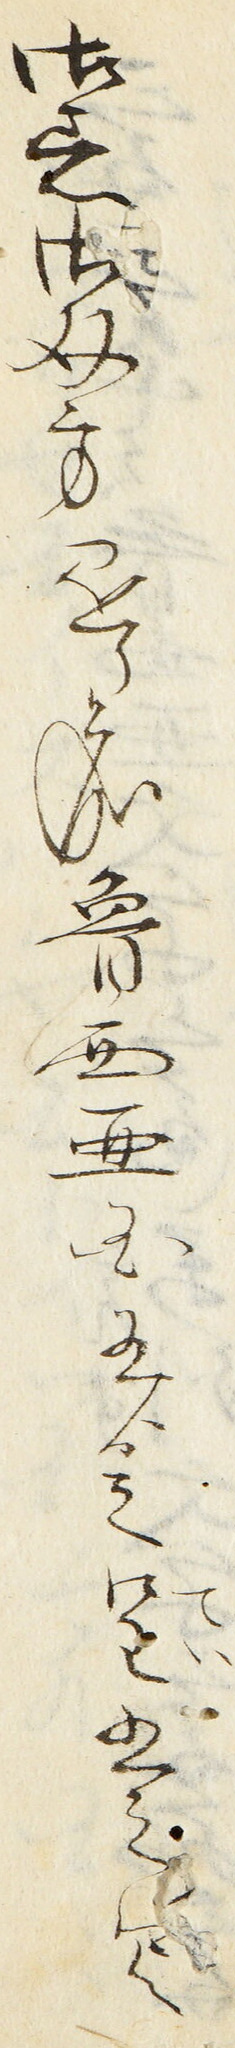御着御双方懸り被成魯西亜国王より之呈書之

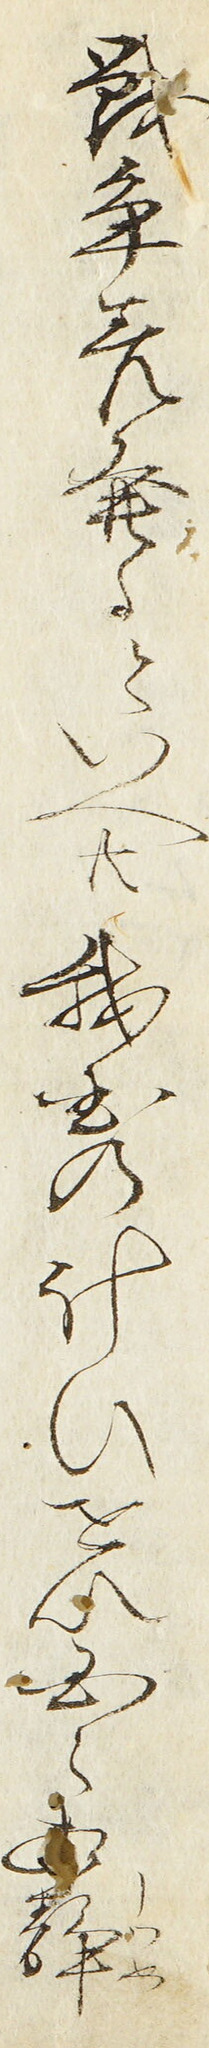戦争差発るといへ共我国の計ひを以国々相鎮
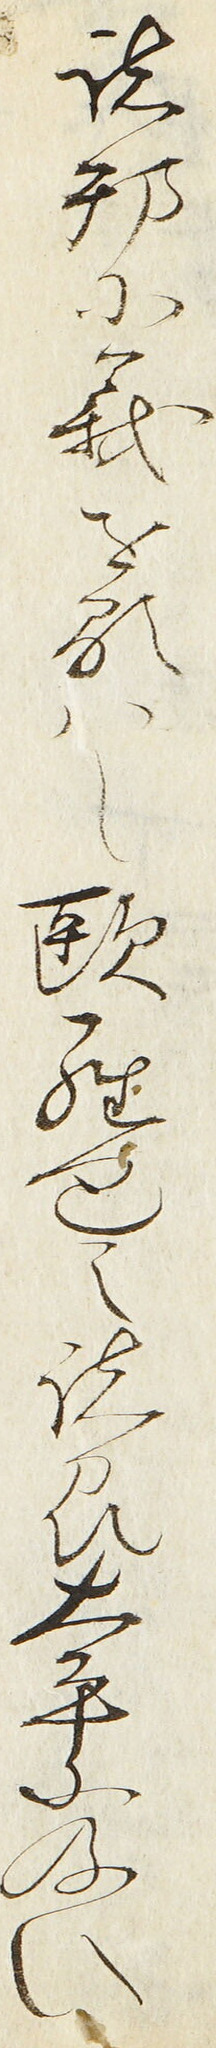諸邦に義を顕はし欧羅巴之諸州太平に及ひ
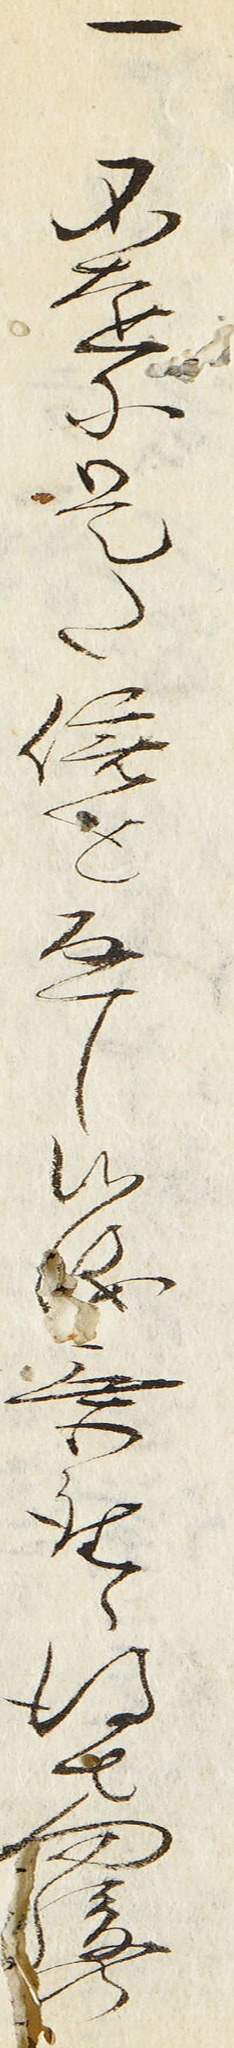一不遠に是迄信を通し候儀無御座候得は向後の
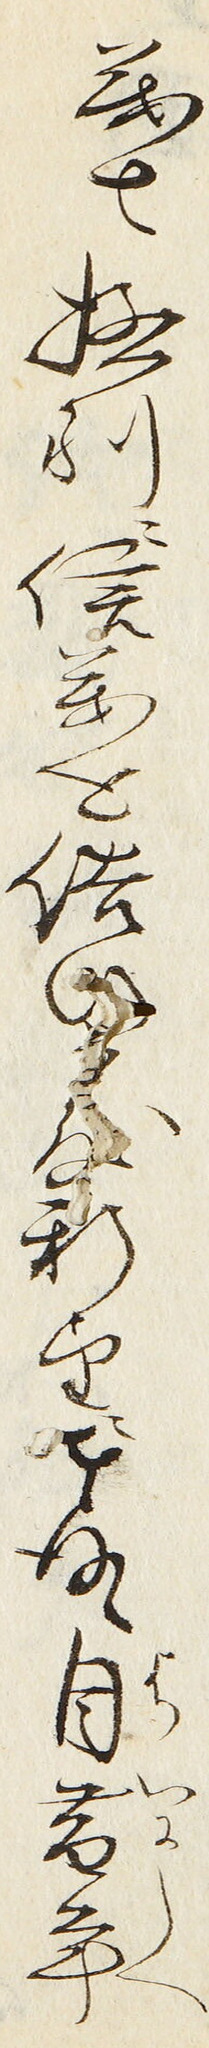義は格別に信義を結ひ申度祈望に奉存候自昔年
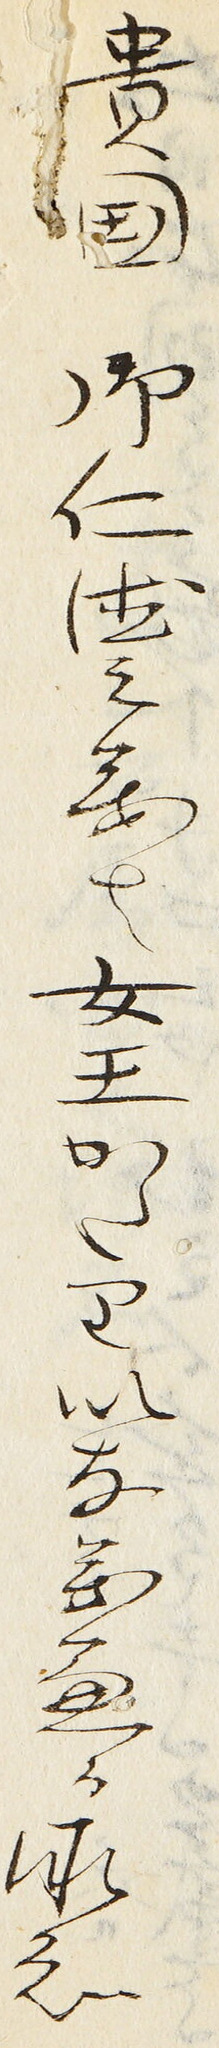貴国御人徳之義は女王かたりいな義兼て承知
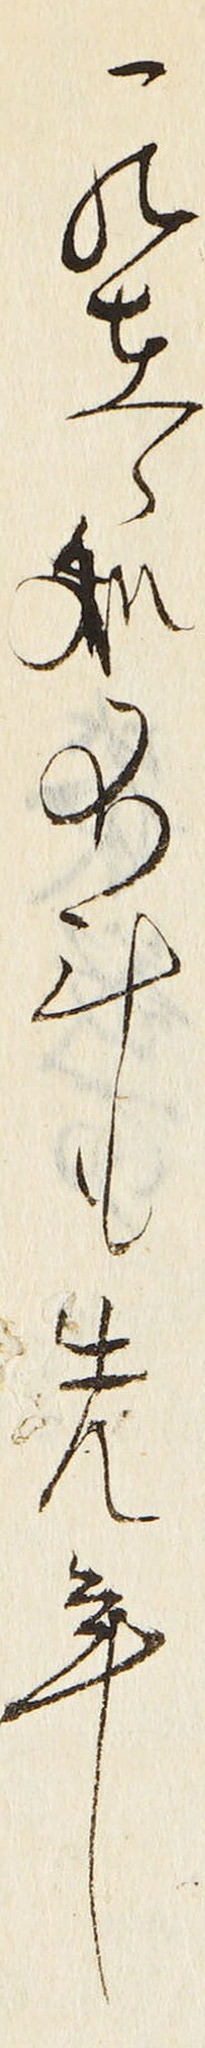罷在候処不計も先年
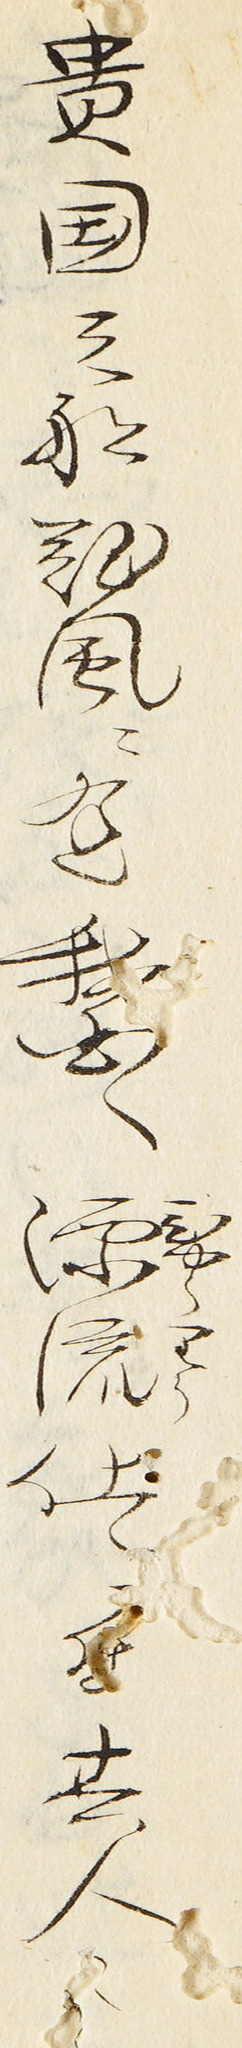貴国之船難風に逢我国へ漂流仕候に付其人に
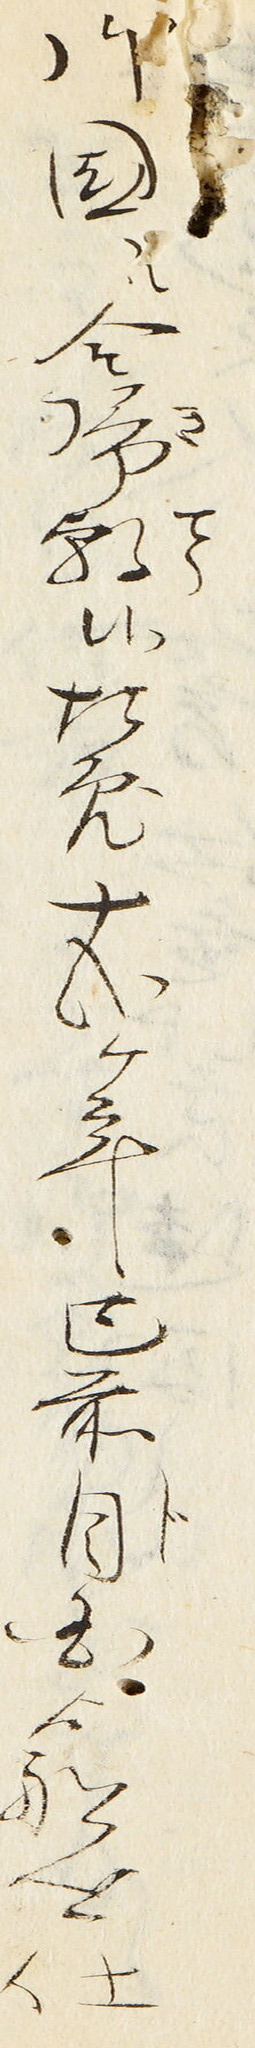御国え合帰朝候ため十弐ヶ年已前自国より船を仕
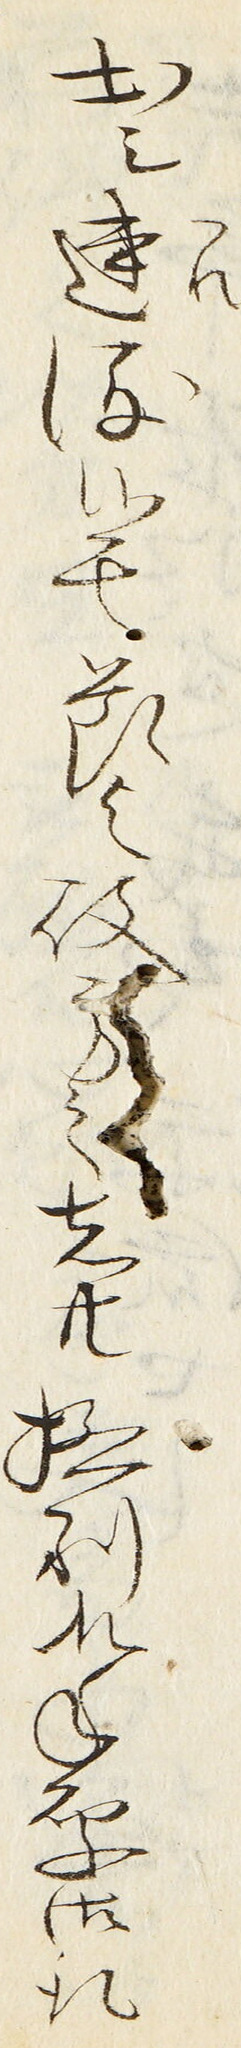出し連渡候其節之役方之者共格別御手厚御取
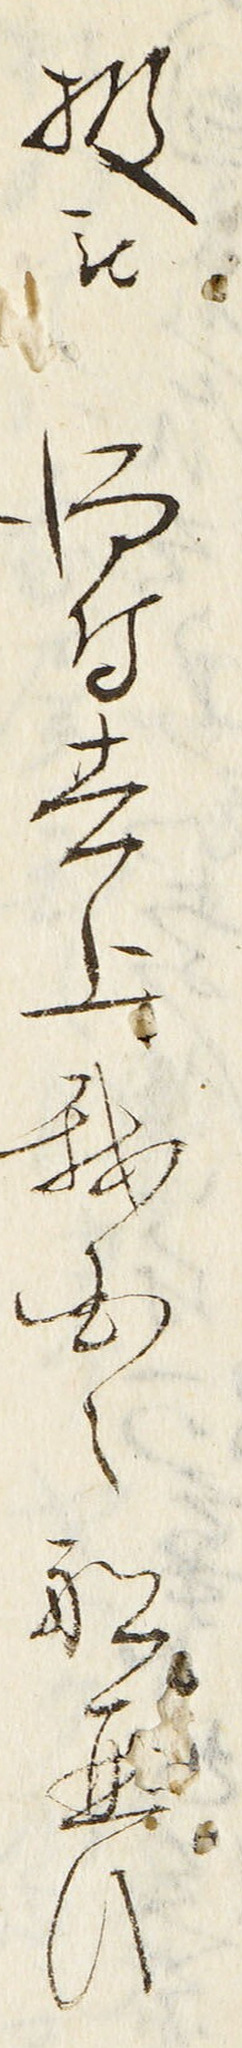扱被仰付其上我国之船再ひ
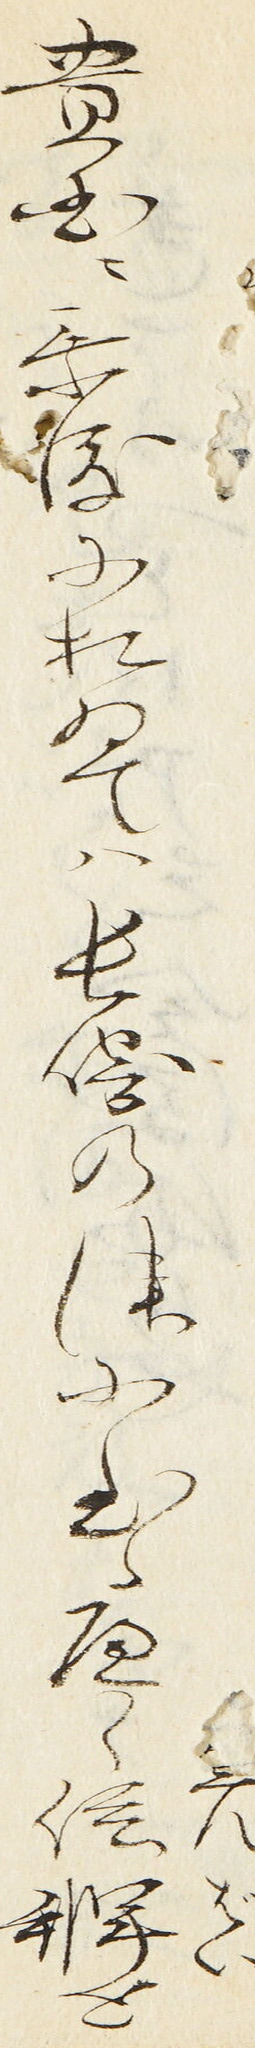貴国に乗度におゐては長崎の津に至るへく信牌を
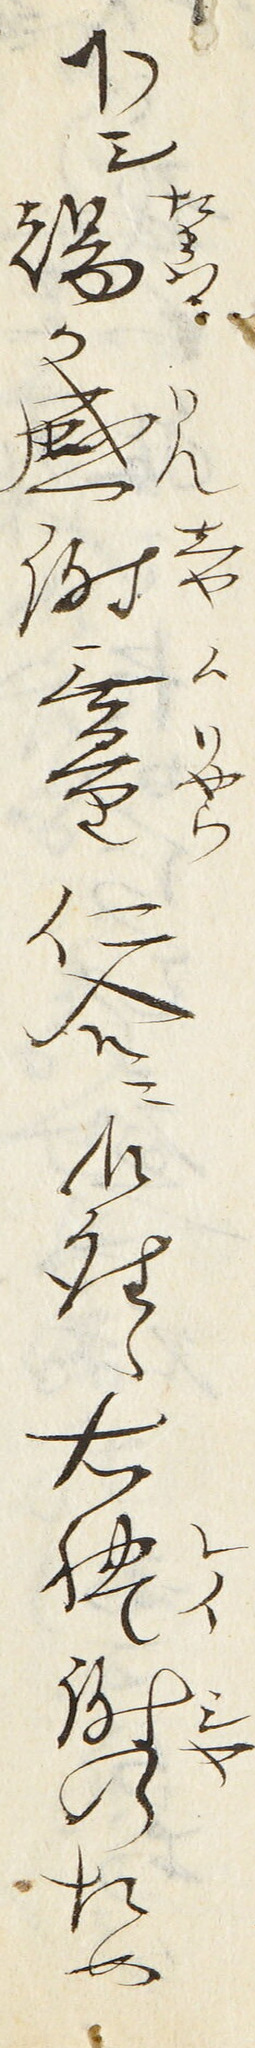下し賜り感謝無量仁合に御座候右礼謝のため
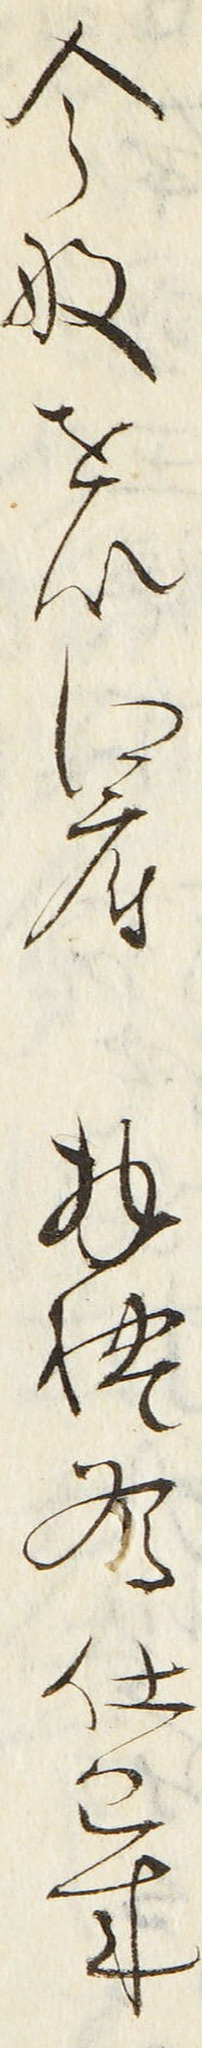今般を以江府拝礼為仕以来
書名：魯西亜国舟渡来始末并日本流漂人異国遍歴之話（西洋欧羅巴州之内一）
